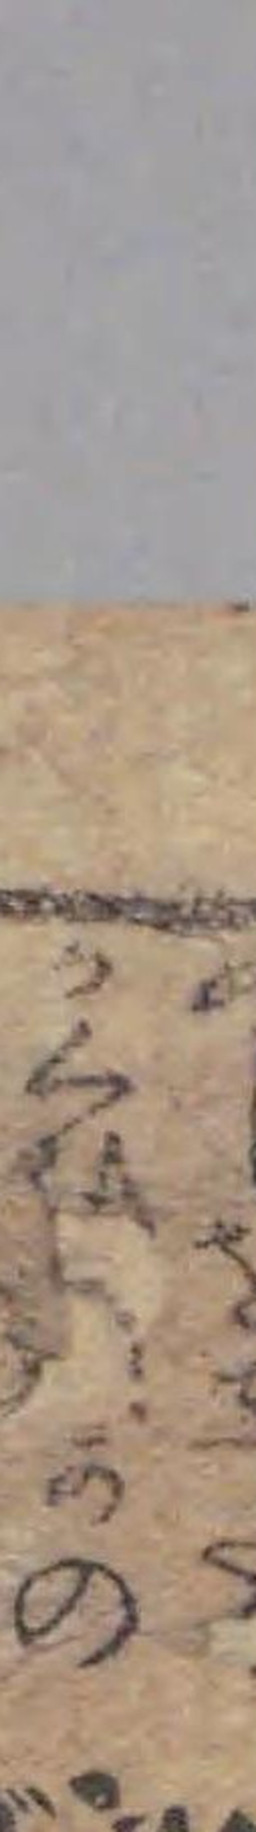かくひかの
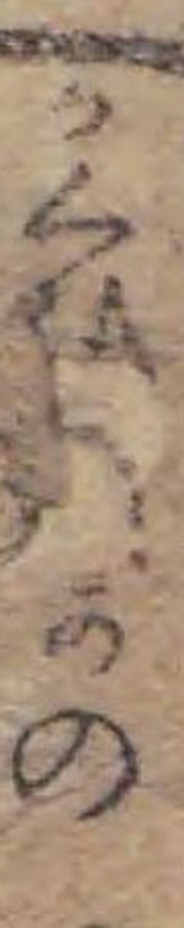かくひかの
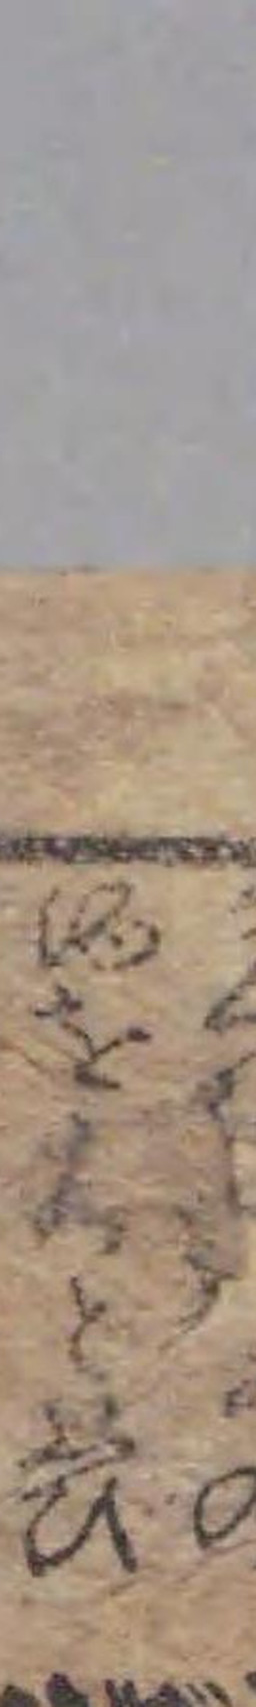酒を水と思ひ
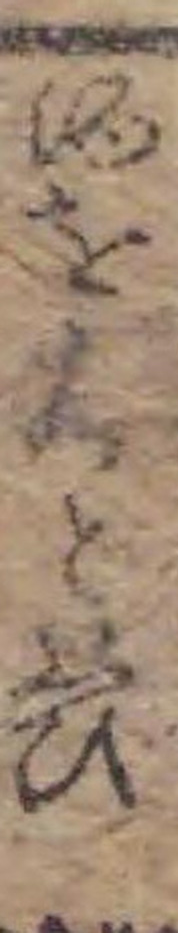酒を水と思ひ
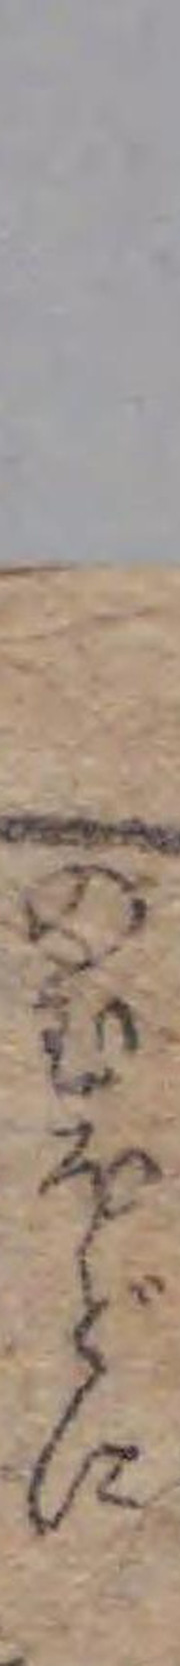のむほどに
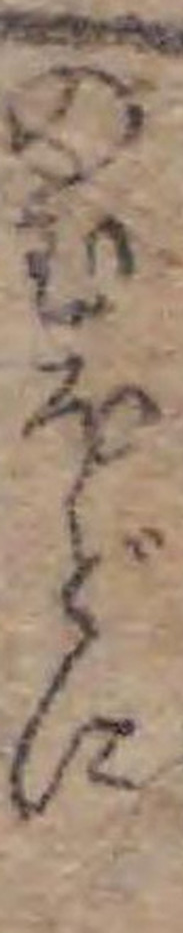のむほどに
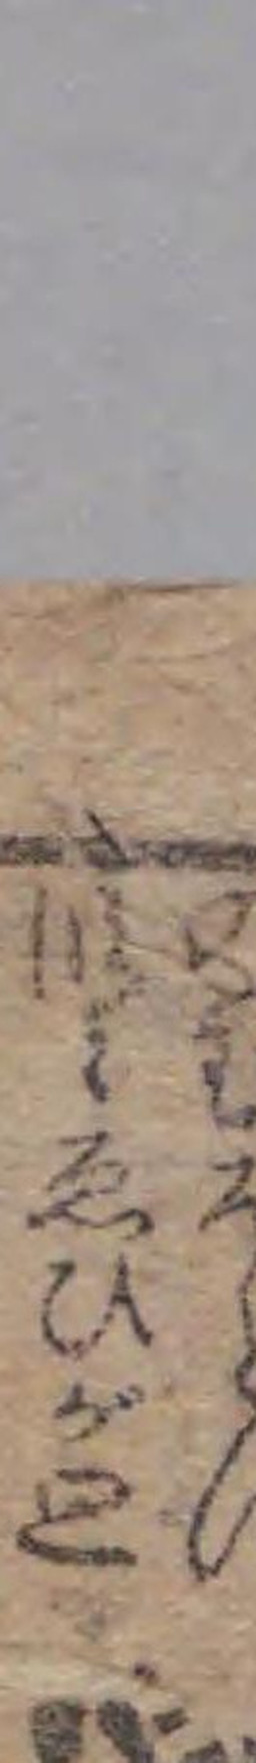段々ゑひが廻
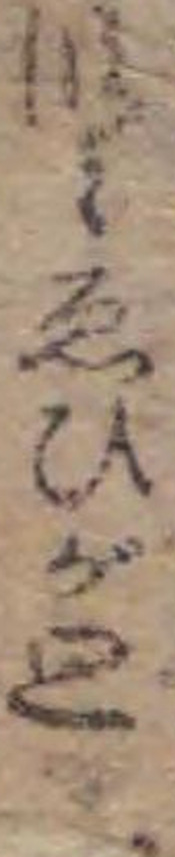段々ゑひが廻
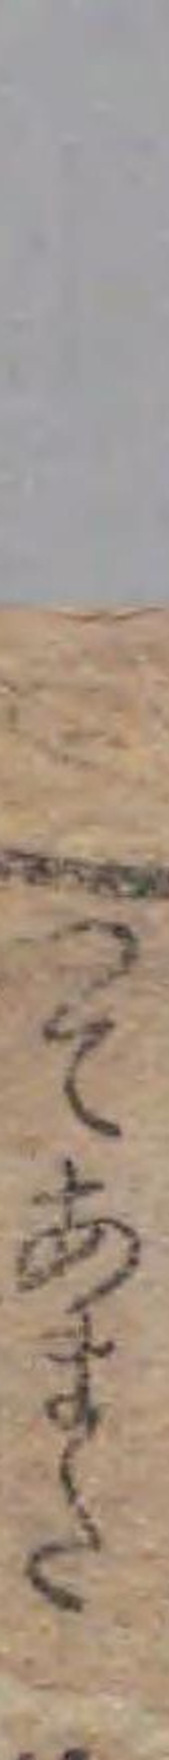つてあまた
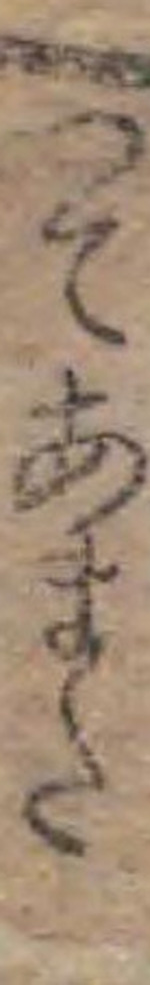つてあまた
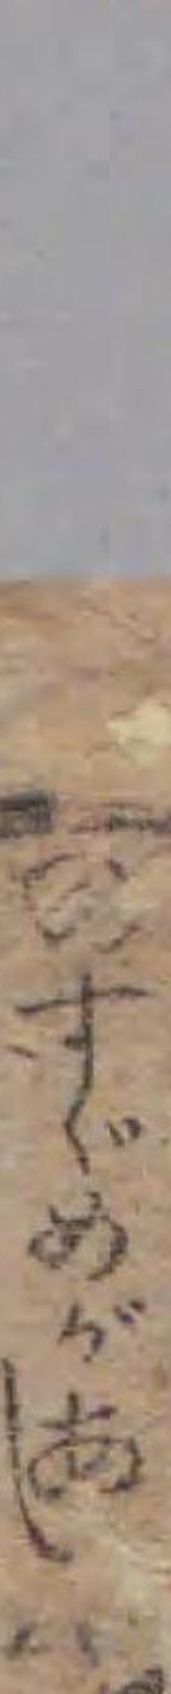のすゞめがあし
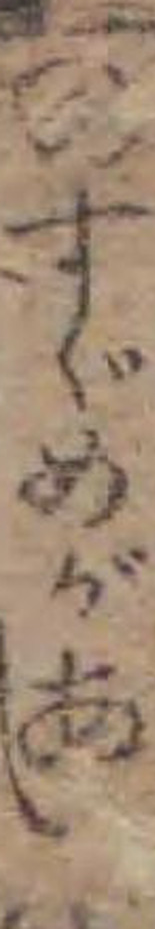のすゞめがあし
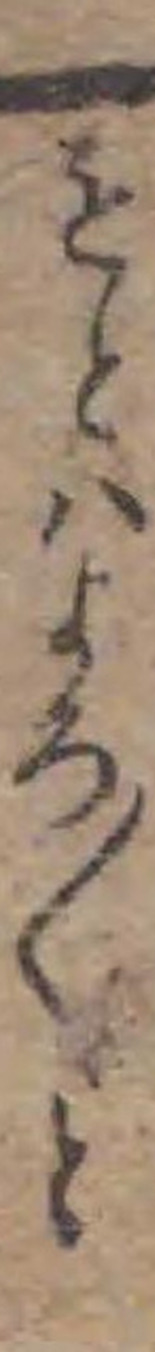もとはよろ〳〵と
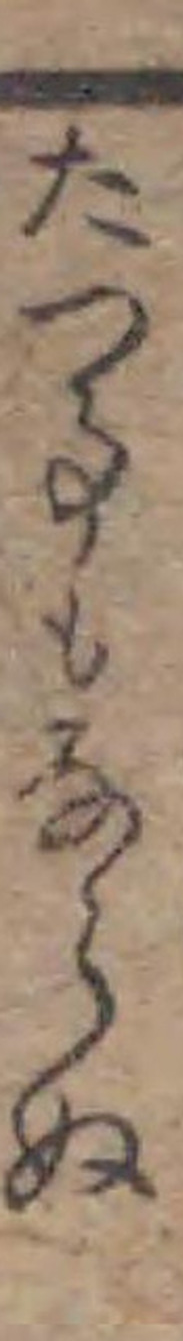たつ事もならぬ
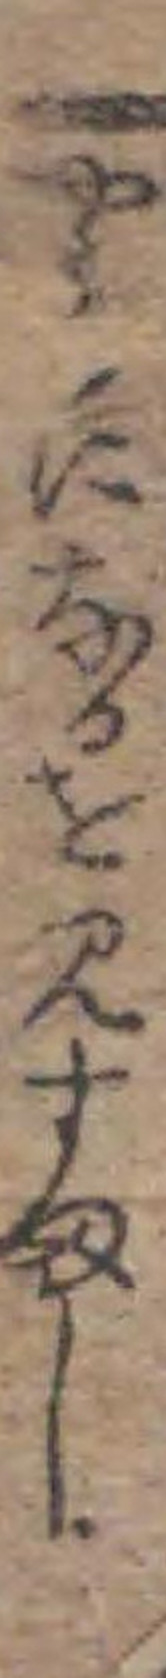やうになるを見すまし
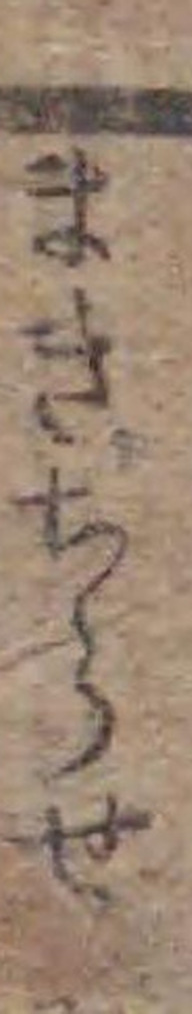まきちらせ
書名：虚言八百万八伝 : 3巻
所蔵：国立国会図書館 National Diet Library, JAPAN
